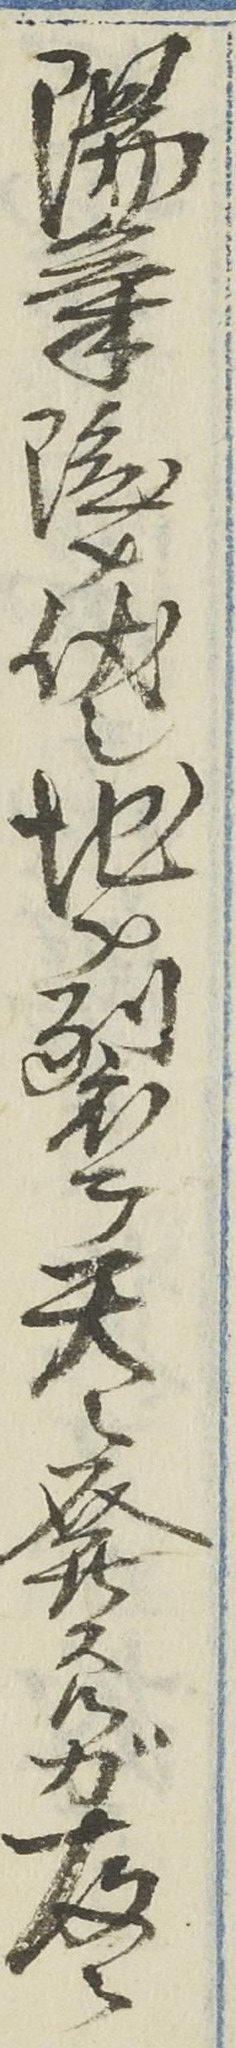陽氣陰ヲ伏し地ヲ裂テ天ニ発スルガ故ニ
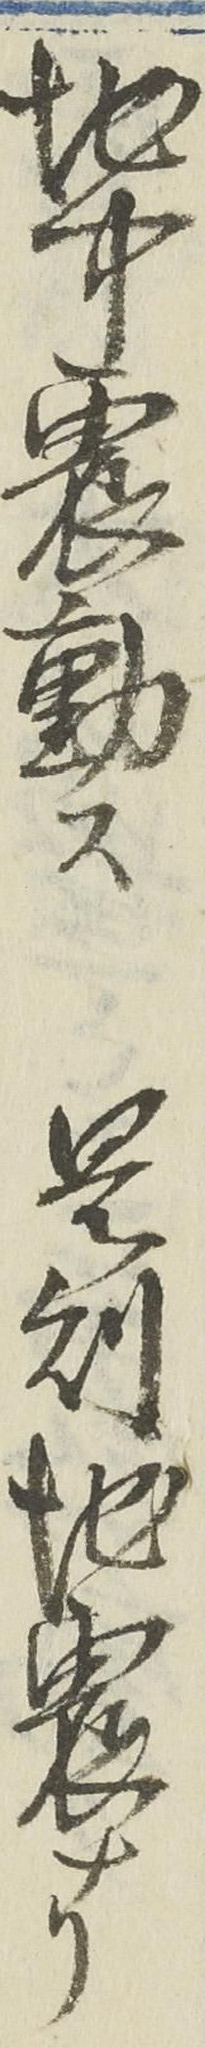地中震動ス是則地震ナリ
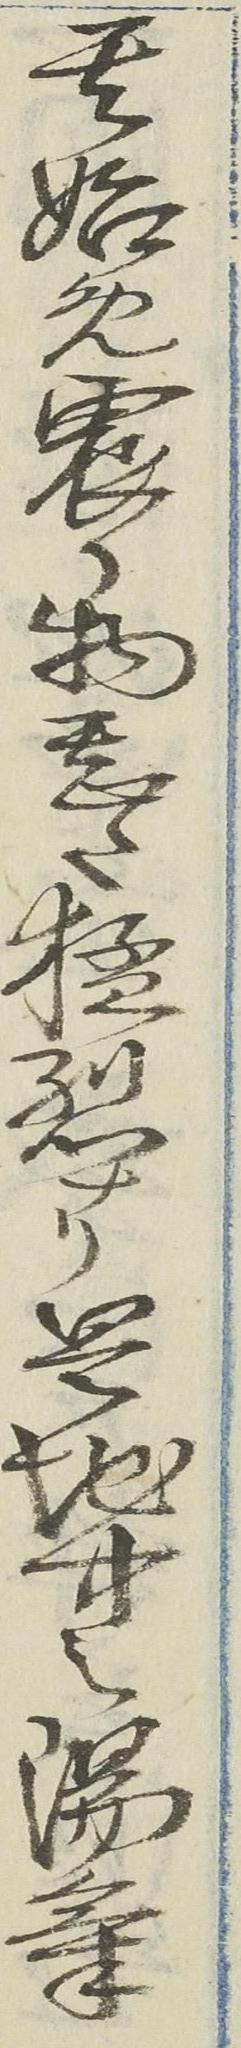其始め震ウ物甚タ猛烈ナリ是地中之陽氣
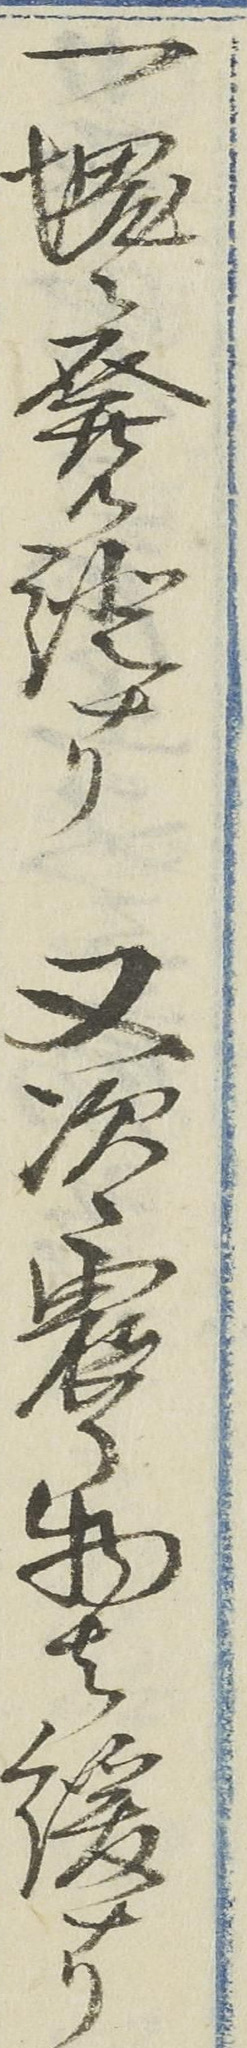一塊ニ発ル證ナリ又次ニ震ウ物は緩ナリ
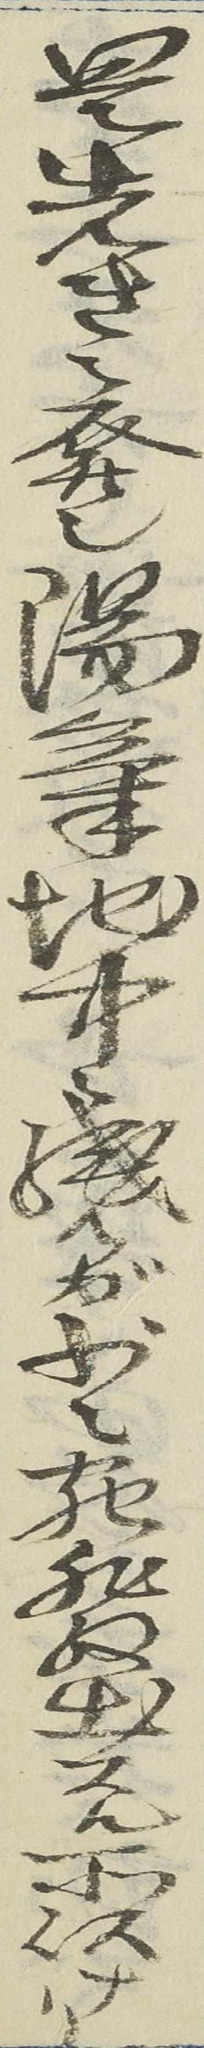是先きニ発し陽氣地中ニ残ルガ少〻宛発出スル所以ナリ

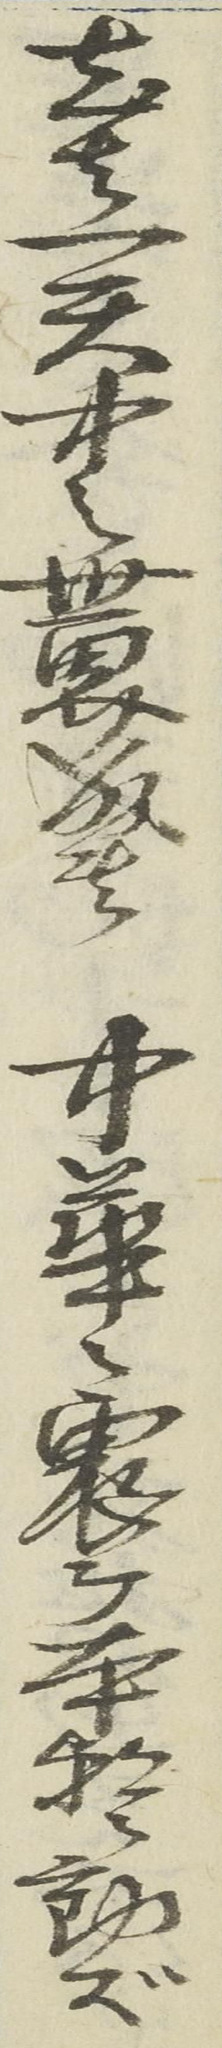去ハ一天中之世界成共中華ニ震テ本朝ニ動ズ
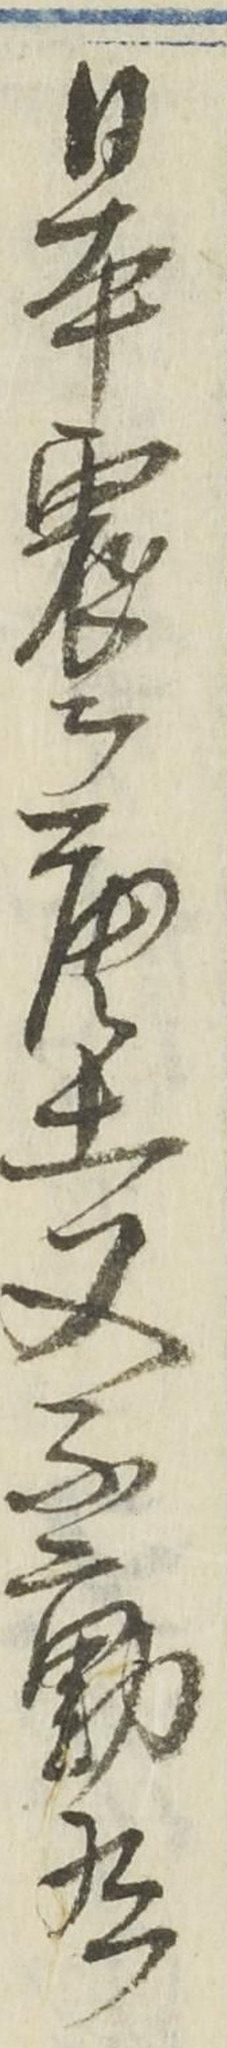日本震テ唐土又不動有
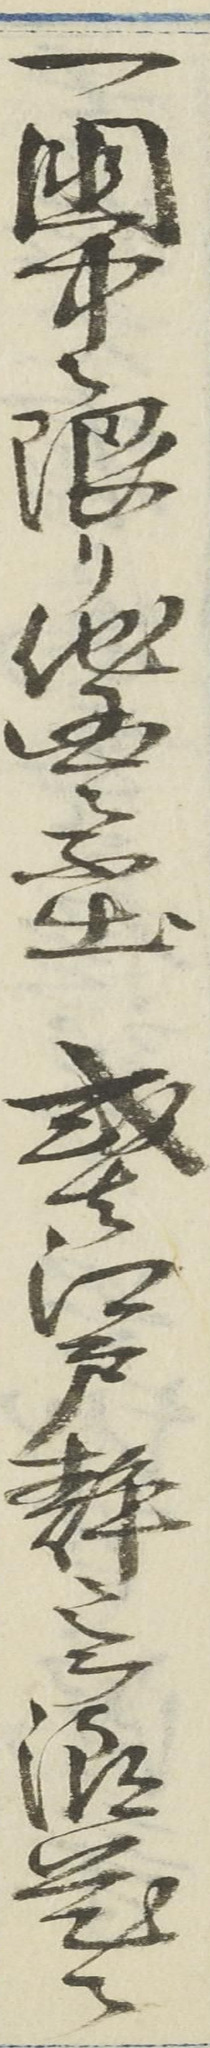一国中ニ限リ他国ニ不出或は江戸静ニシテ浪花ニ
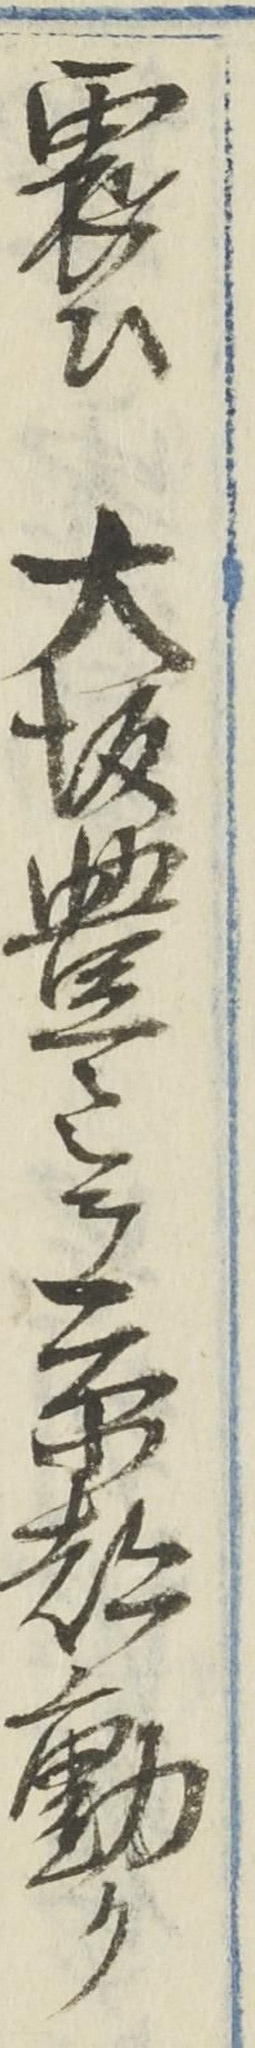震ひ大坂豊ニシテ京都動ク
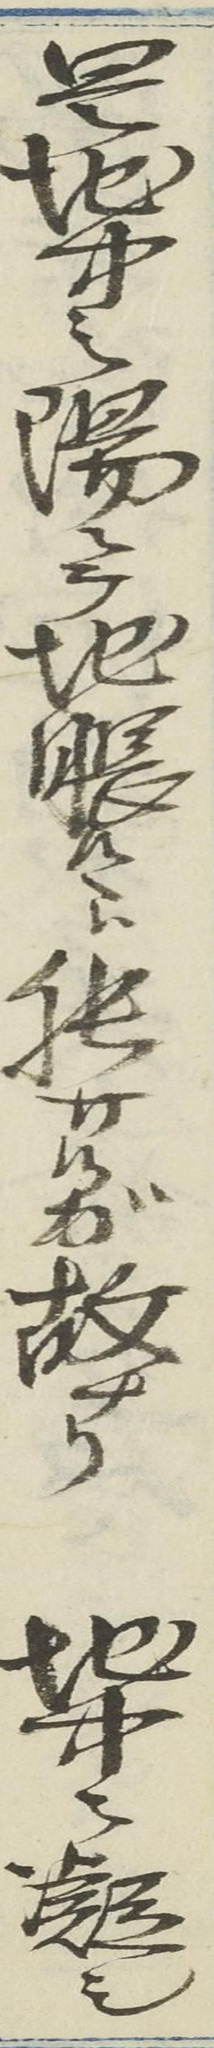是地中是陽ニテ地脹ルヽト脹サルガ故ナリ地中二凝シ
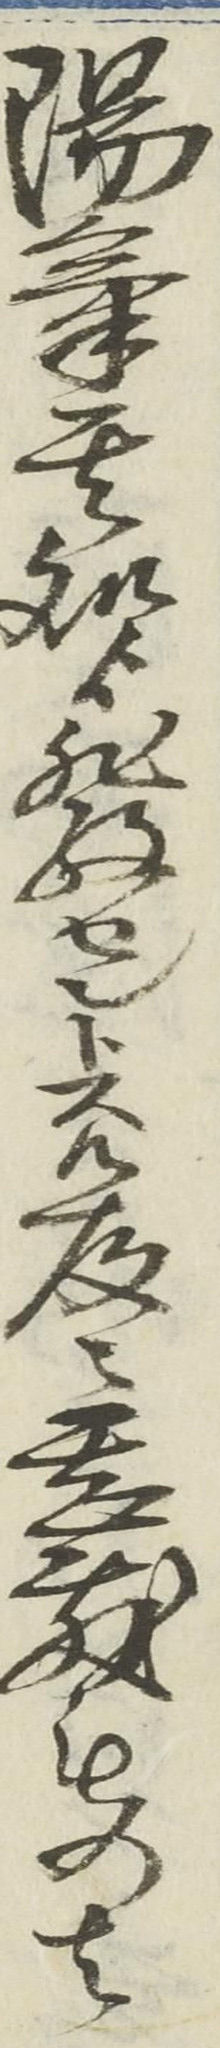陽氣其処ゟ發セントスル故ニ甚敷モノハ
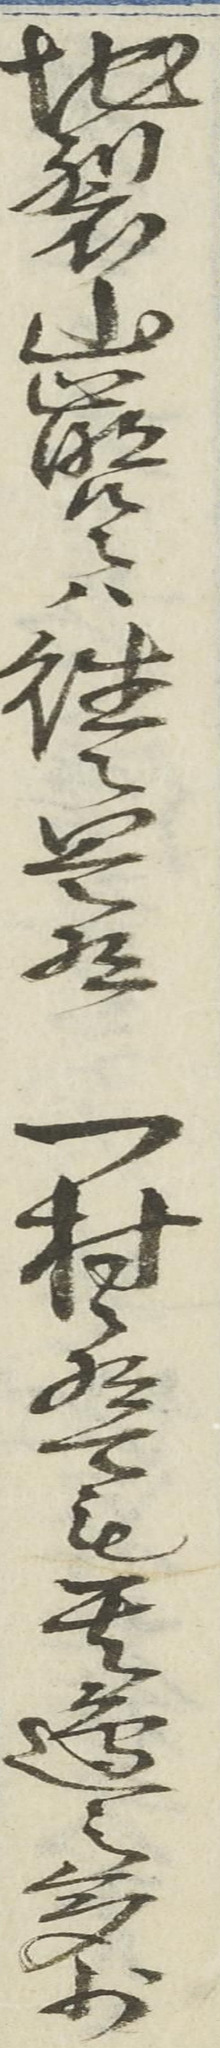地裂山崩ルニハ往〻是有一村ニ有テモ其辺之多少
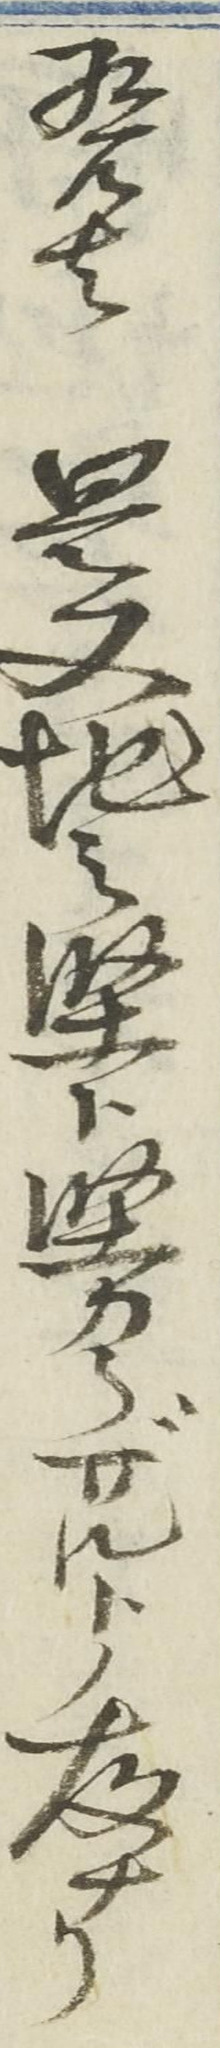有ルハ是又地之堅ト堅カラザルトノ故ナリ
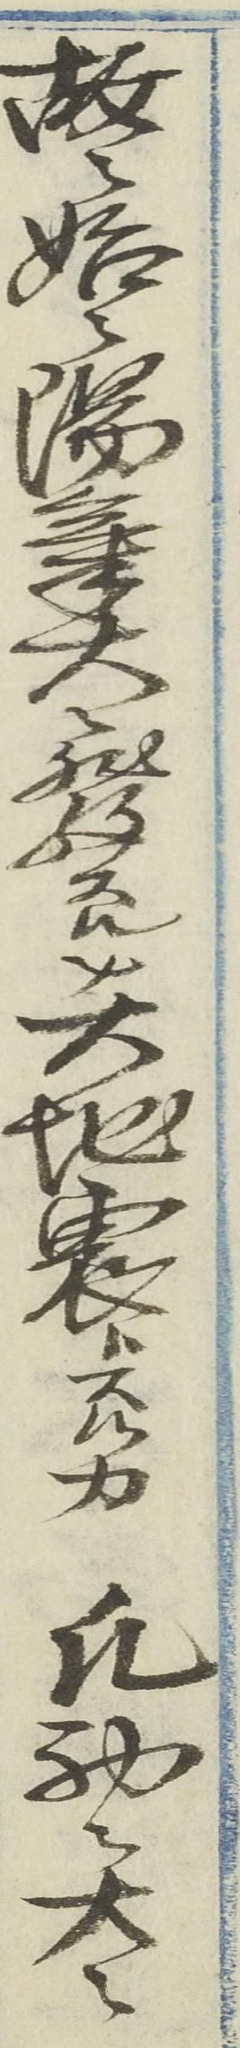故ニ始ニ陽氣大ニ發スルヲ大地震トスルカ凡初ニ大ニ
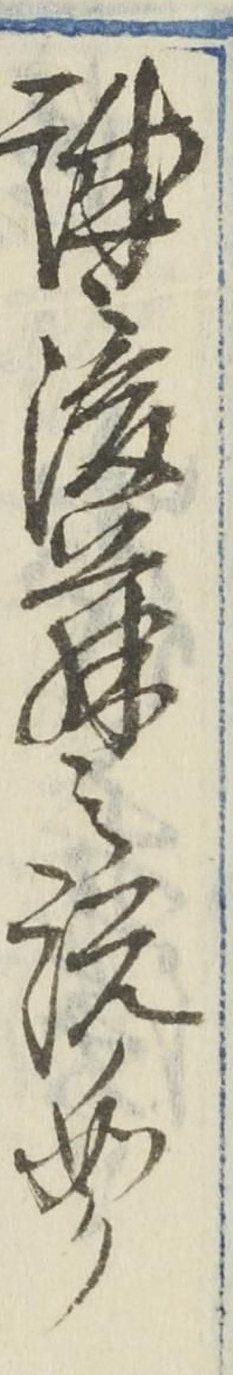誠ニ後藤之説ノ如ク
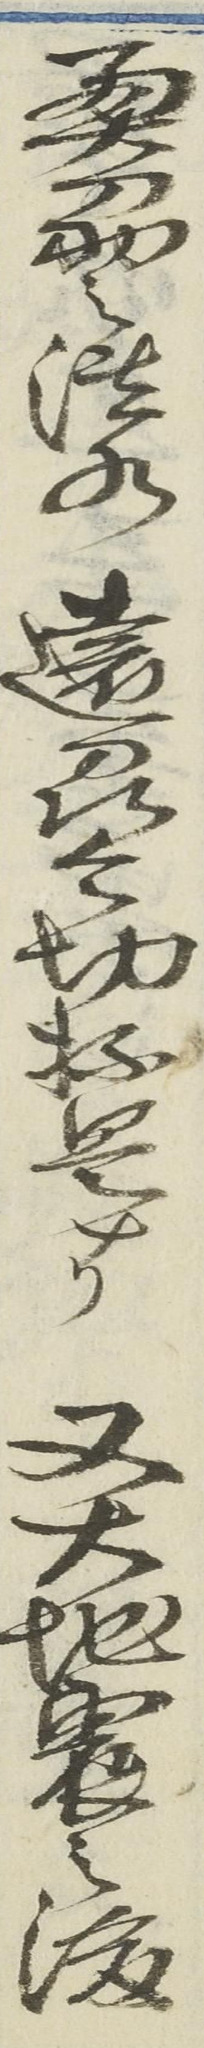奥州之淇水遠州今切抔是ナリ又大地震之後
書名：伏水大地震
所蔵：東京大学地震研究所図書室 Earthquake Research Institute Library, The University of Tokyo, JAPAN
